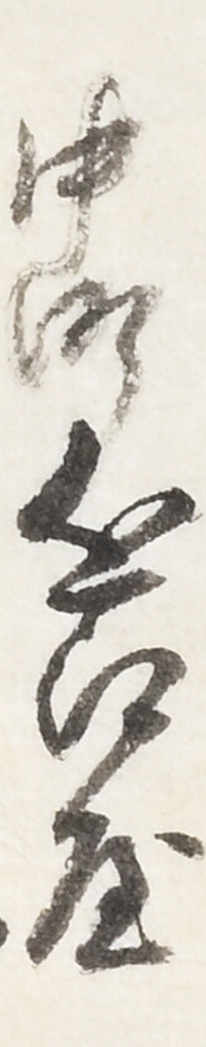中町近江屋
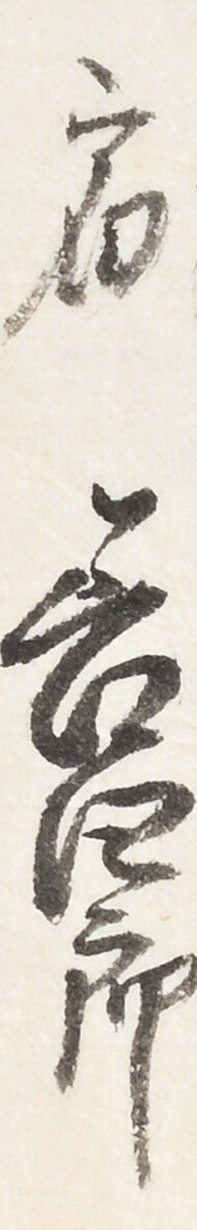宿善四郎
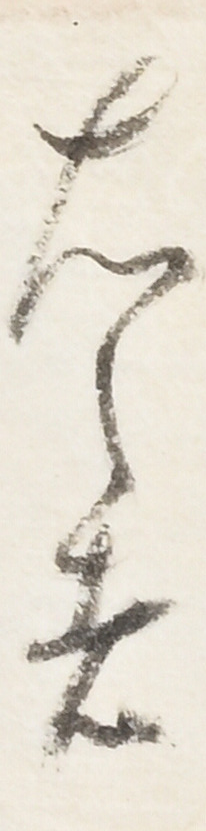右之者
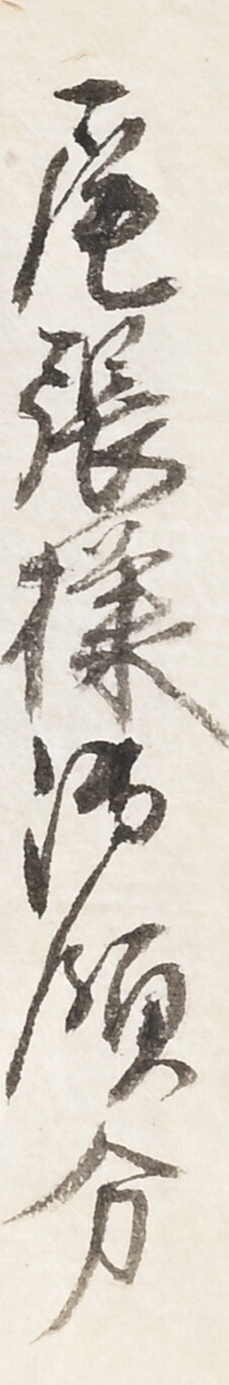尾張様御領分
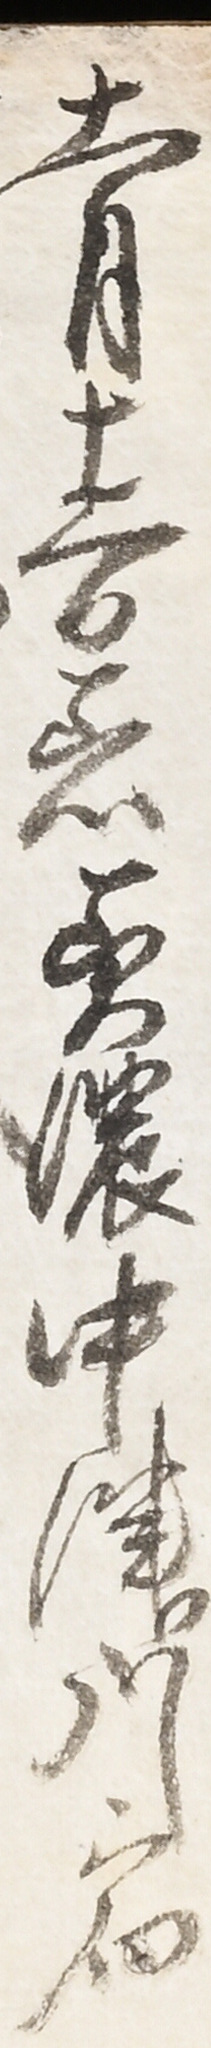十一月十二日着美濃中津川宿
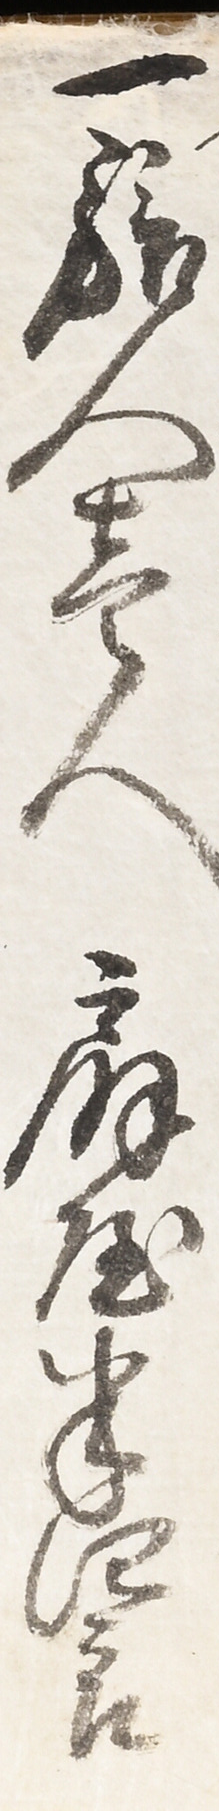一旅人壱人扇屋半四郎
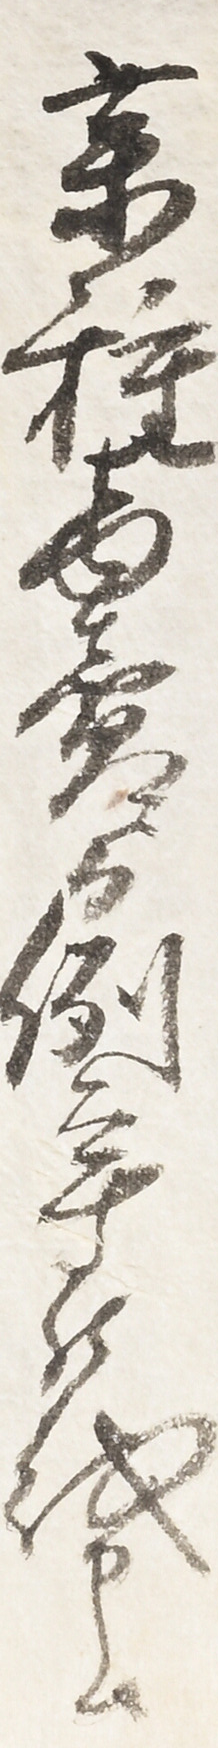薬種商売ニ而例年罷越申候
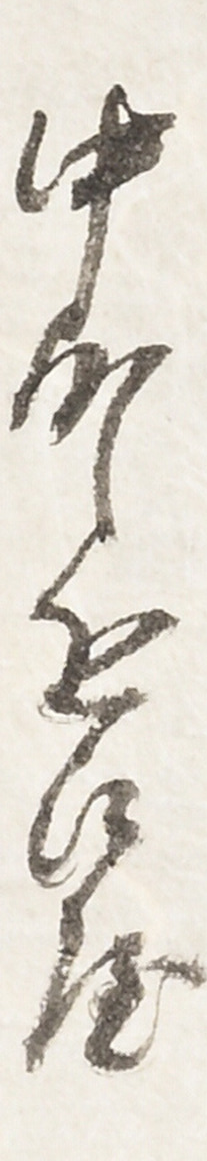中町近江屋
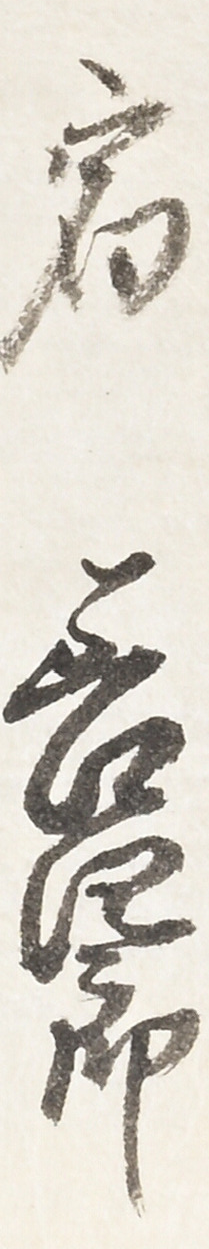宿善四郎
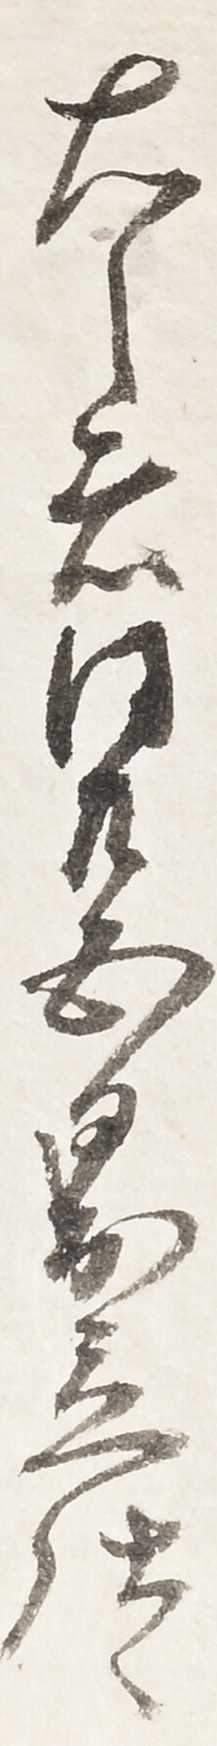右之者同廿五日出立仕候
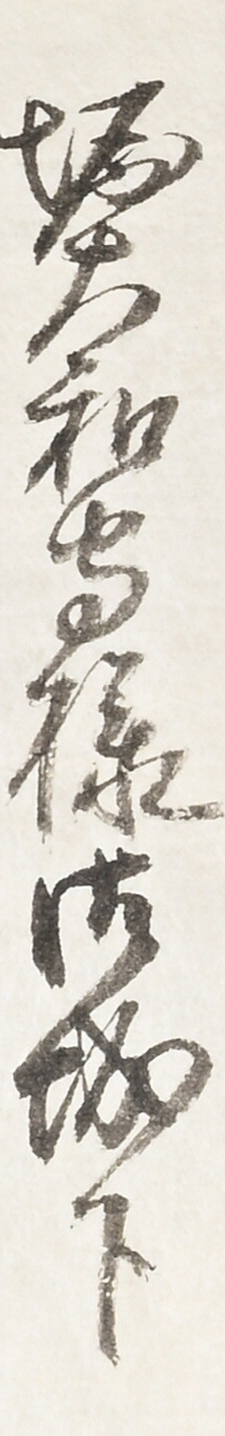堀大和守様御城下
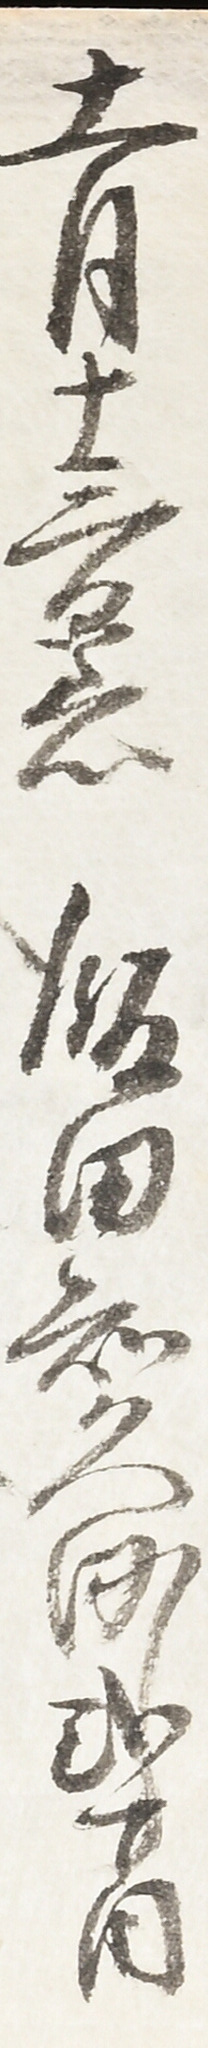十一月十三日着飯田知久町弐丁目
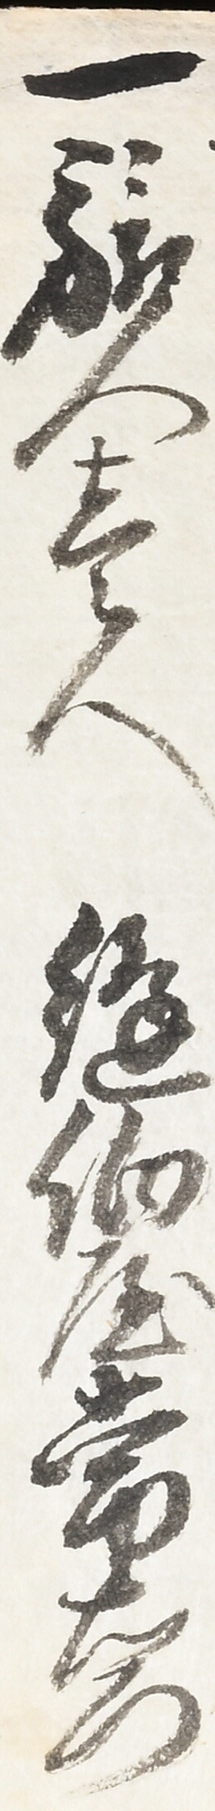一旅人壱人縫伯屋常右衛門
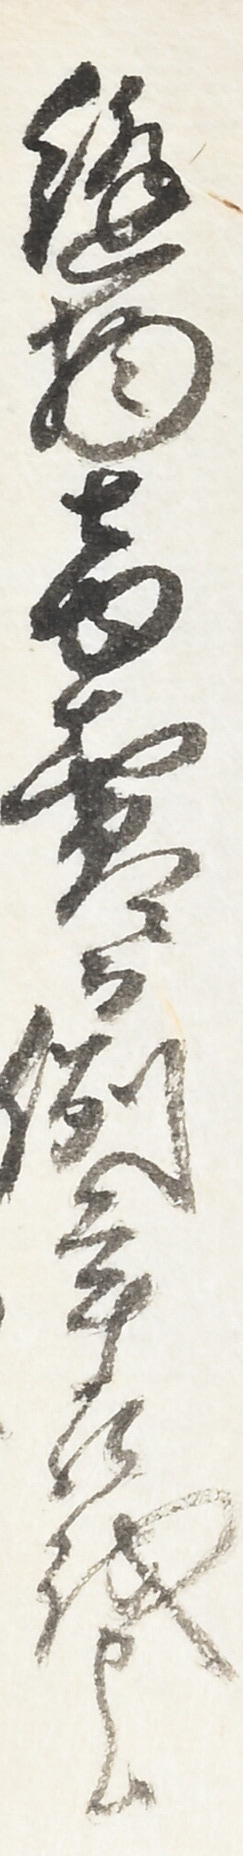縫物商売ニ而例年罷越申候
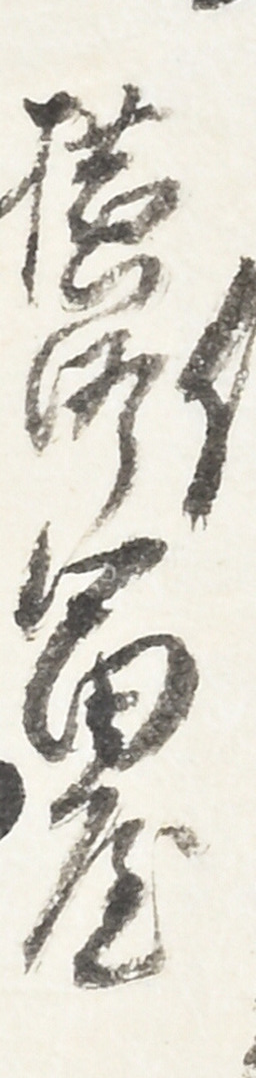横町冨屋
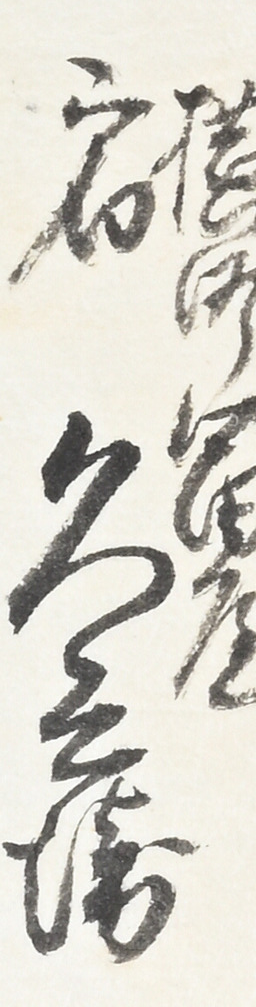宿久兵衛
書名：旅人泊控帳
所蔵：伊那市立高遠町図書館・合同会社AMANE
